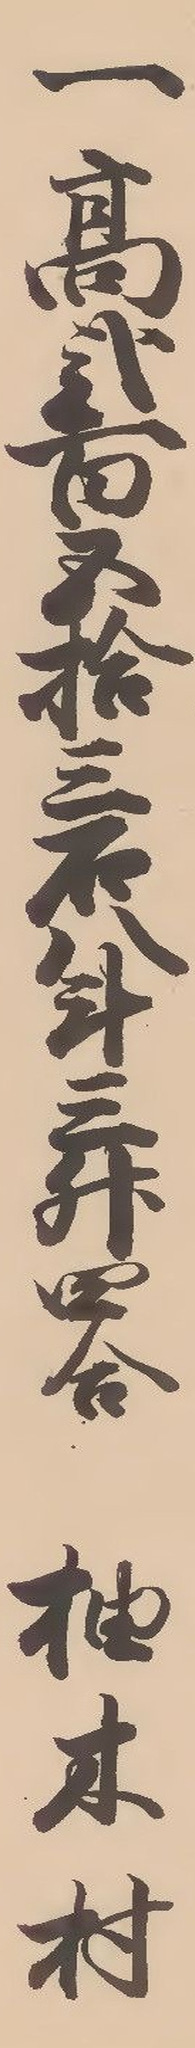一高弐百五拾三石八斗三升四合柚木村
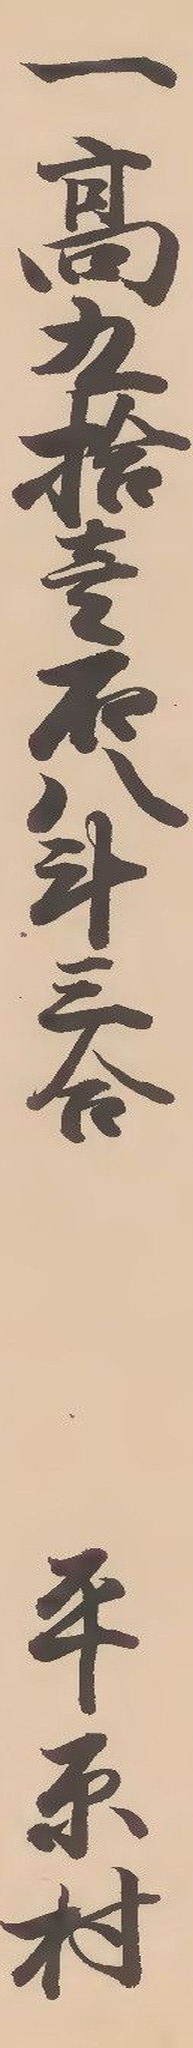一高九拾壱石八斗三合平原村
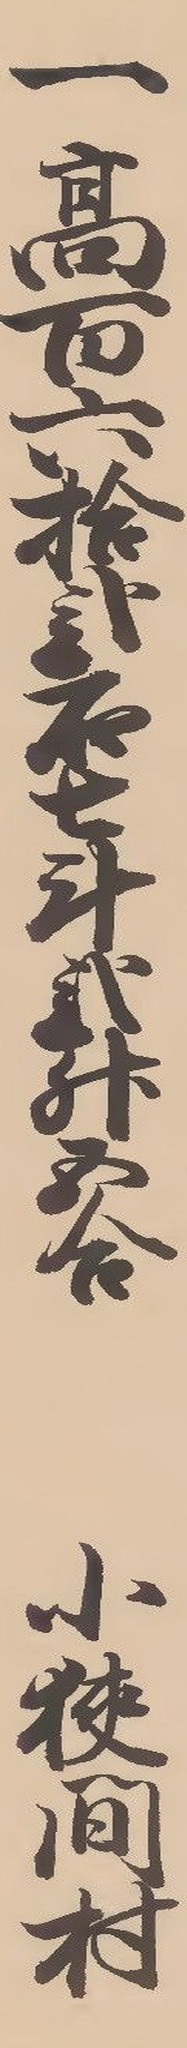一高百六拾弐石七斗弐升五合小狭間村
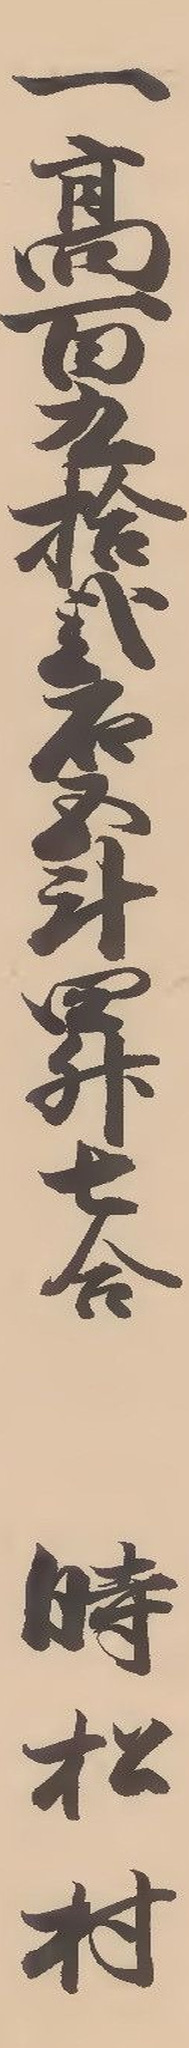一高百九拾弐石五斗四升七合時松村
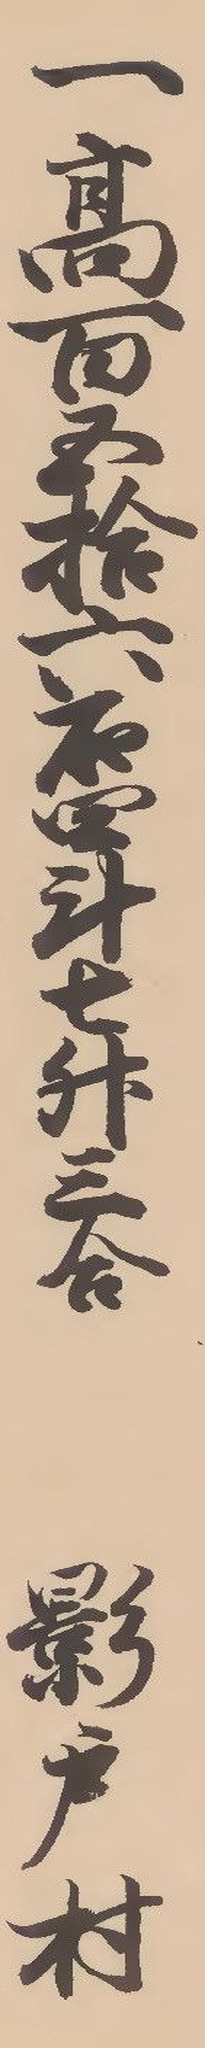一高百五拾六石四斗七升三合影戸村
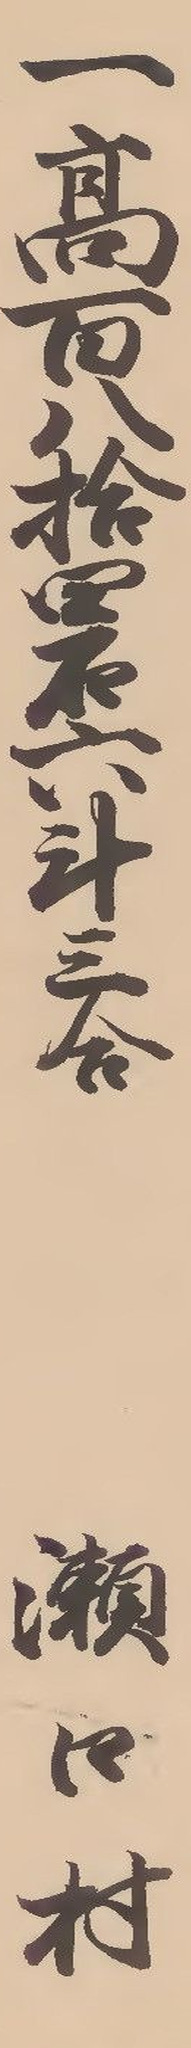一高百八拾四石六斗三合瀬口村

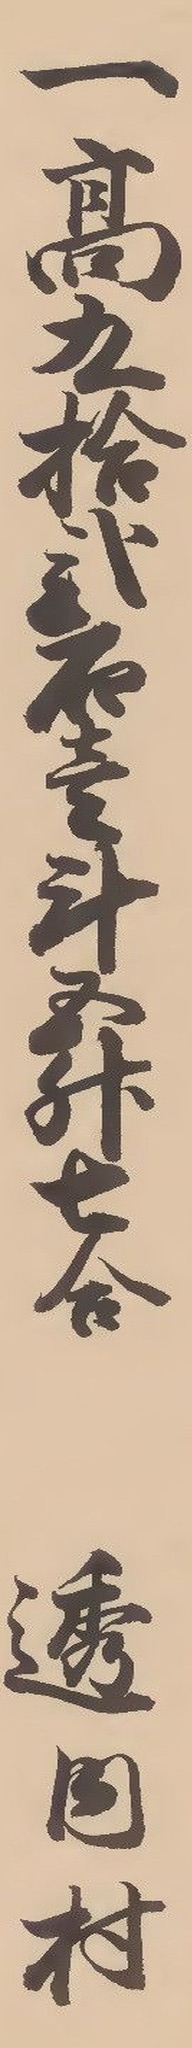一高九拾弐石壱斗五升七合透内村
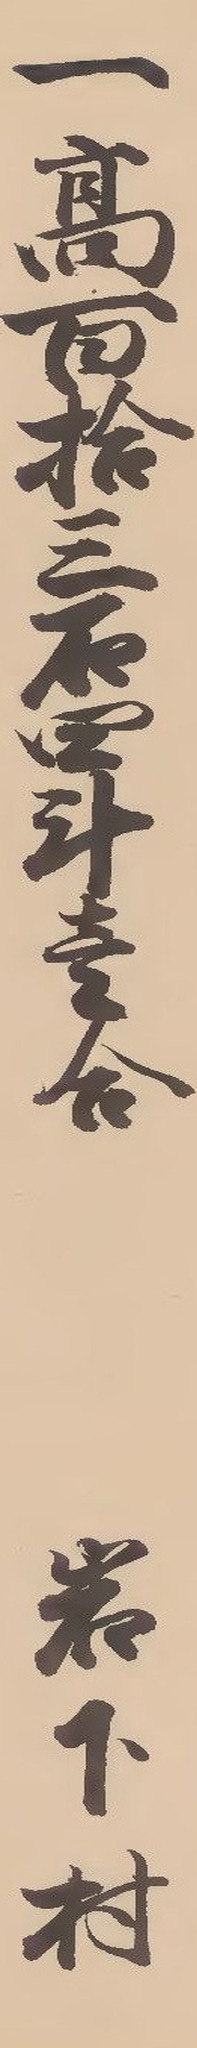一高百拾三石四斗壱合岩下村
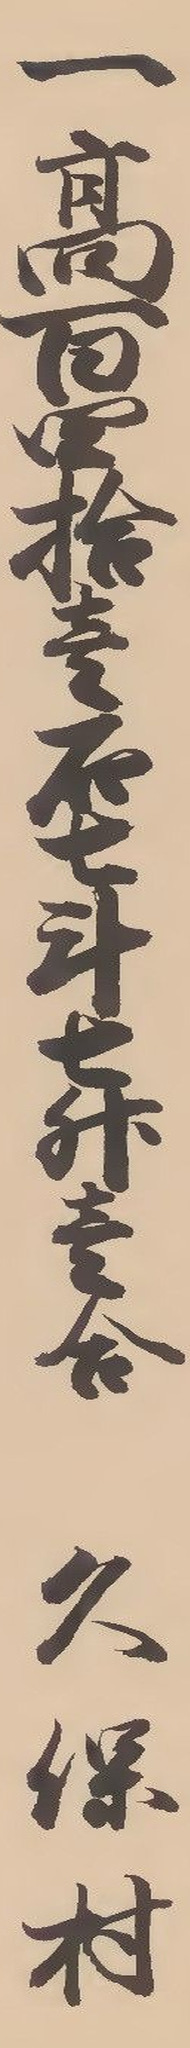一高百四拾壱石七斗七升壱合久保村
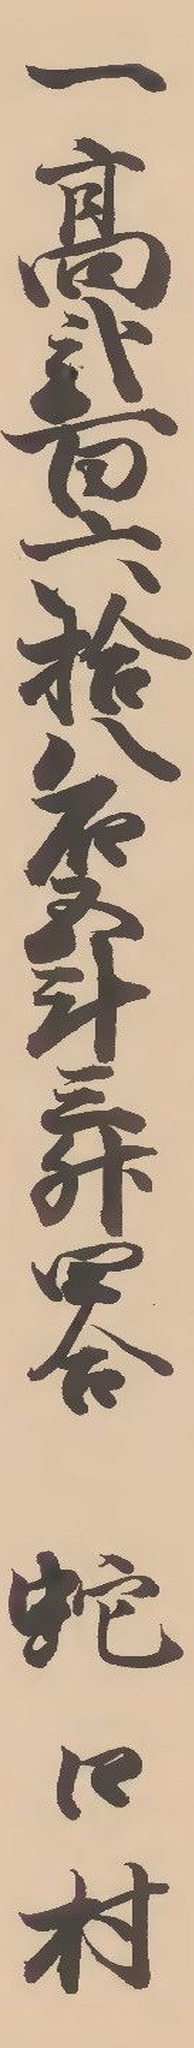一高弐百六拾八石五斗三升四合蛇口村
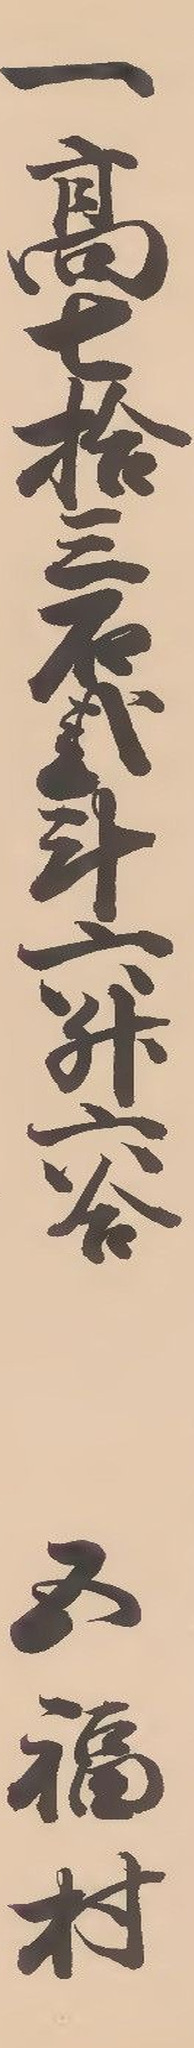一高七拾三石弐斗六升六合五福村
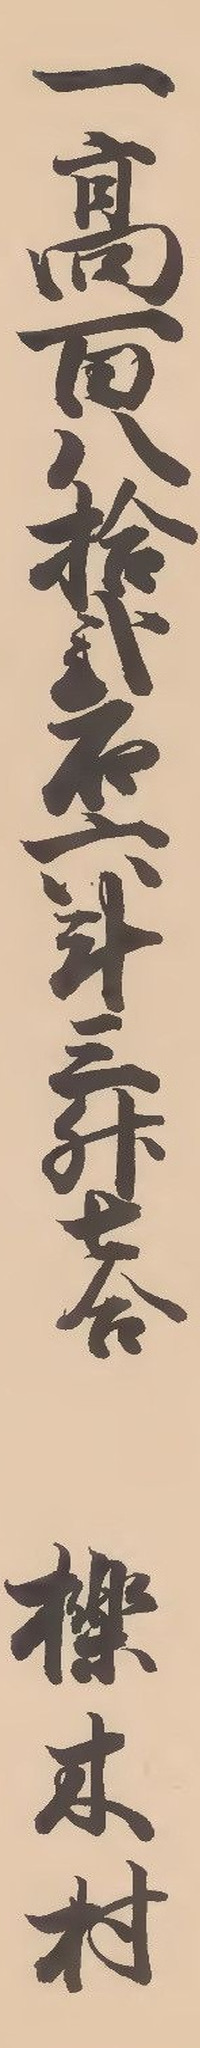一高百八拾弐石六斗三升七合櫟木村
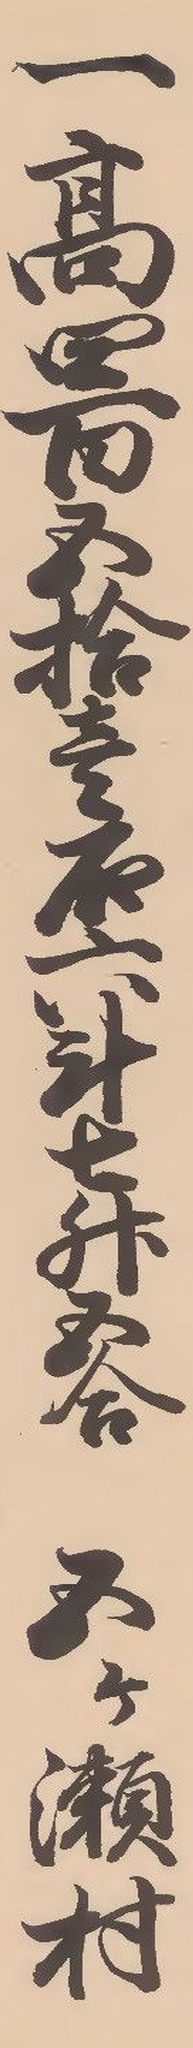一高四百五拾壱石六斗七升五合五ヶ瀬村

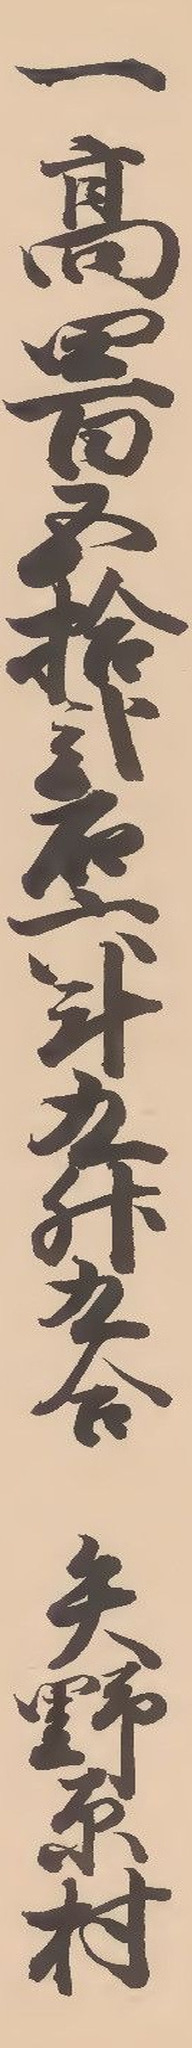一高四百五拾弐石六斗九升九合矢野原村
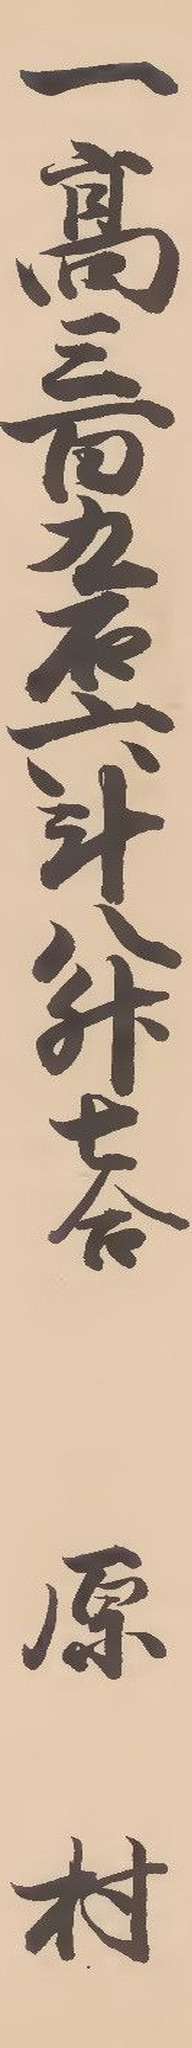一高三百九石六斗八升七合原村
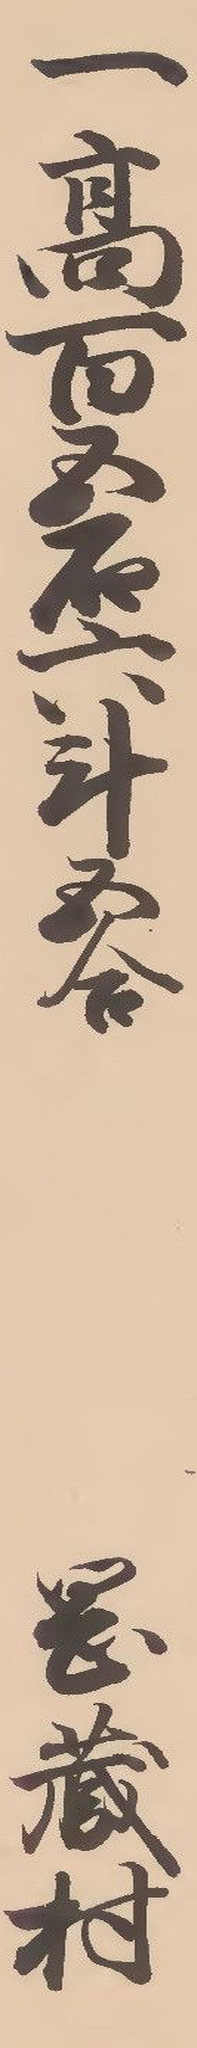一高百五石六斗五合岡蔵村
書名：豊後国郷帳
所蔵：国立公文書館 National Archives of Japan
